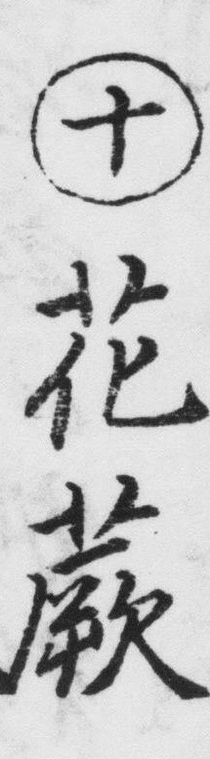(十)花蕨
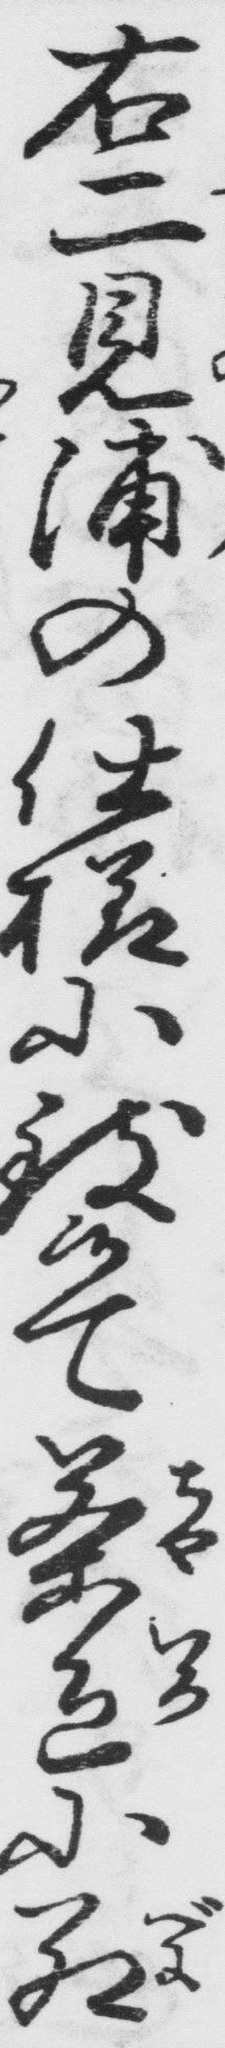右二見浦の仕様に致候て茶色に紅
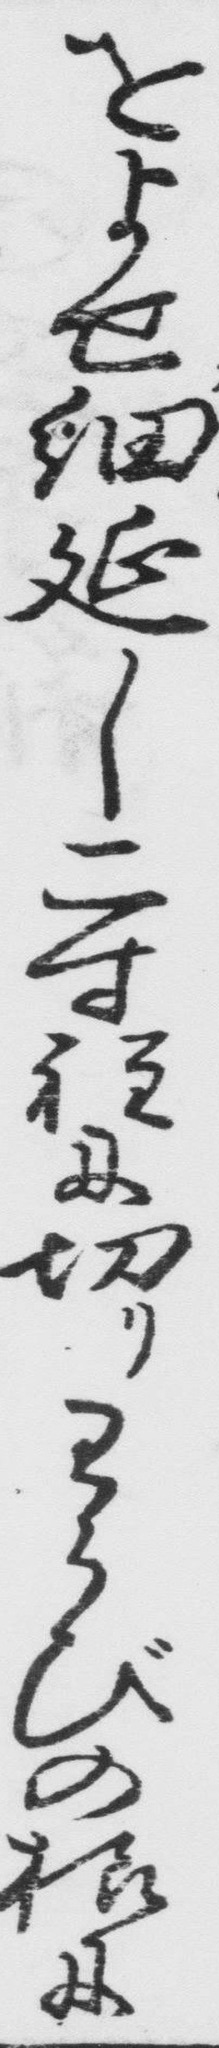をよせ細延し二寸程に切りわらびの様に
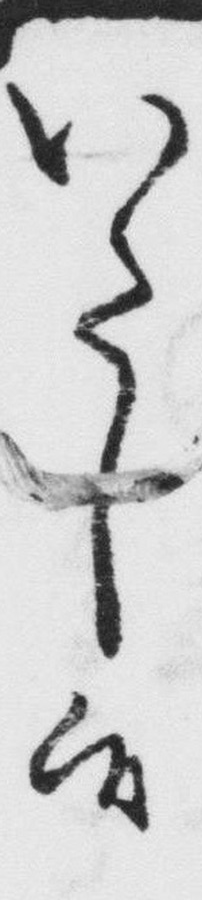いたし候
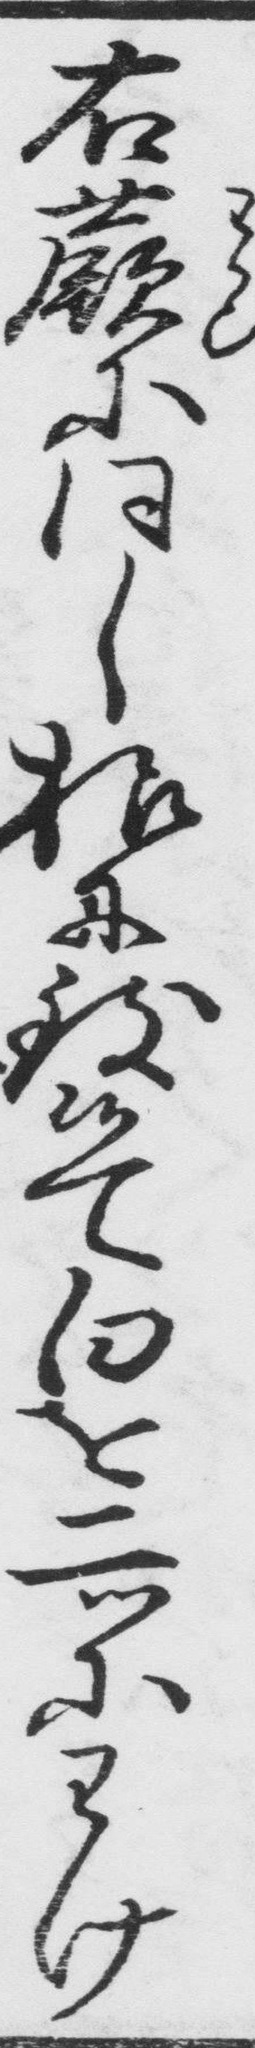右蕨に同し様に致候て白を二ツにわけ
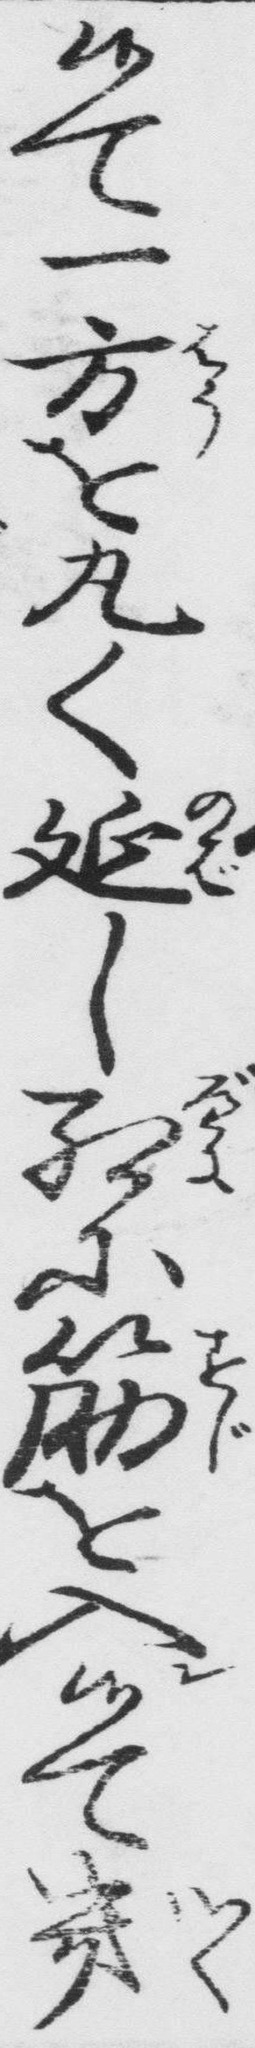候て一方を丸く延し紅に筋を入れ候て幾
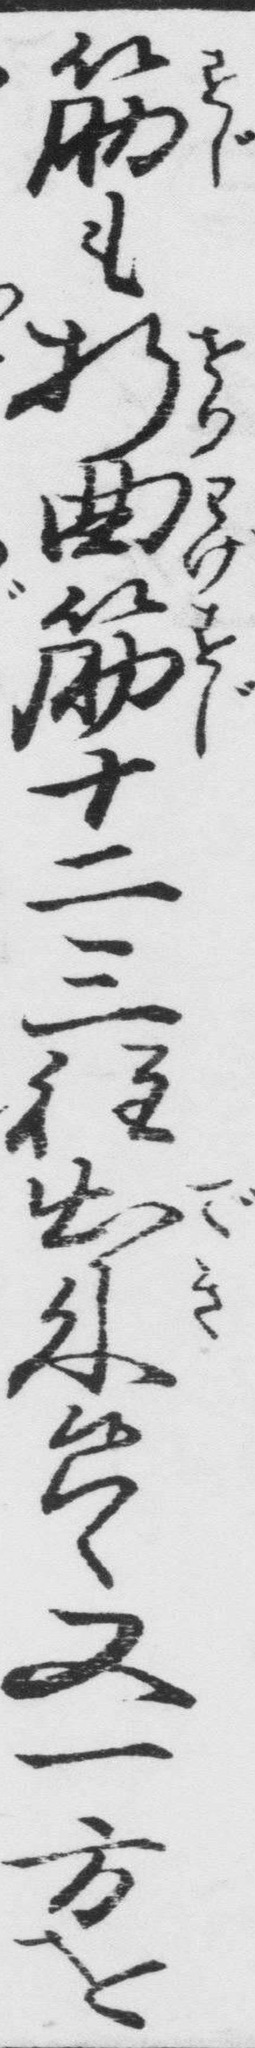筋も折曲筋十二三程出来候はゝ又一方を
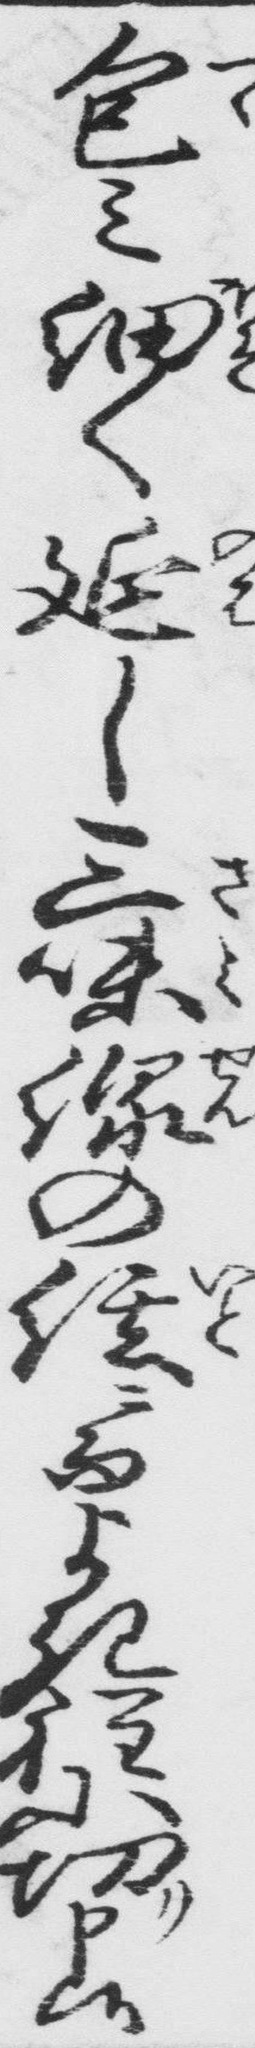包み細く延し三味線の絃にてよき程に切り申候
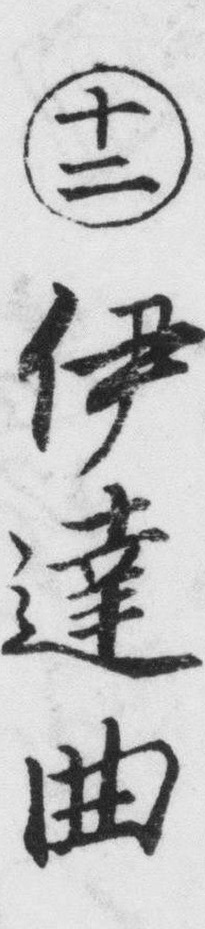(十二)伊達曲

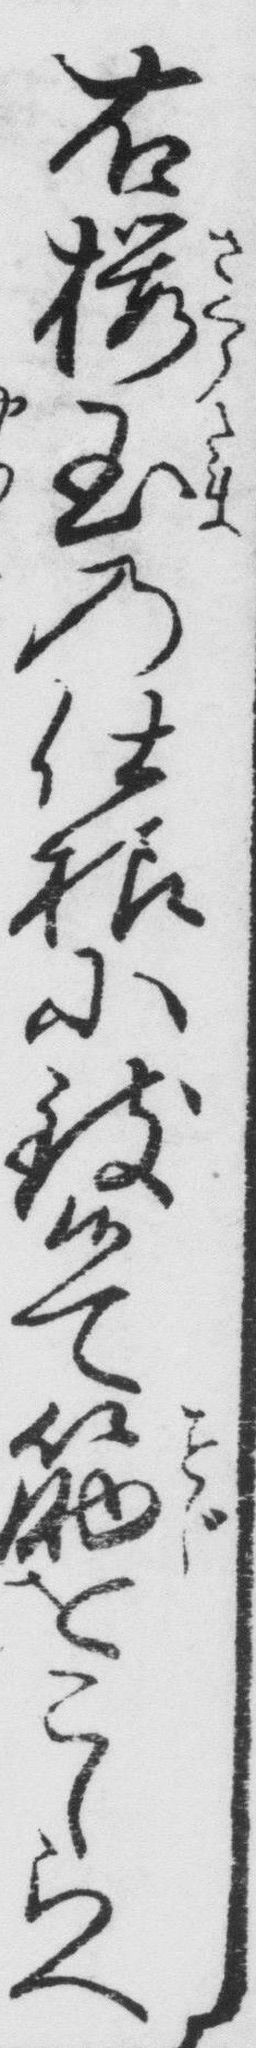右桜玉の仕様に致候て筋をこしらへ
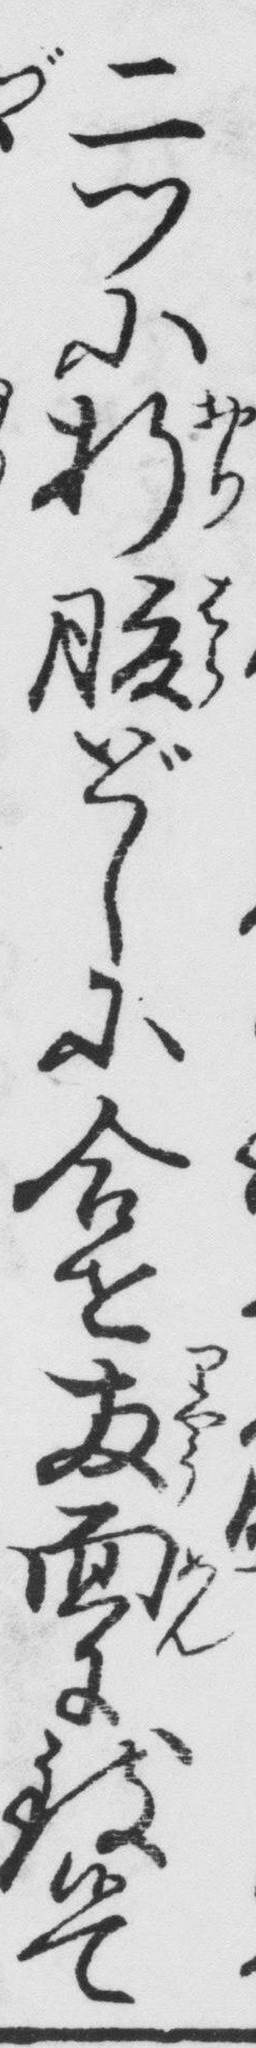二ツに折腹どしに合せ両面に致候て
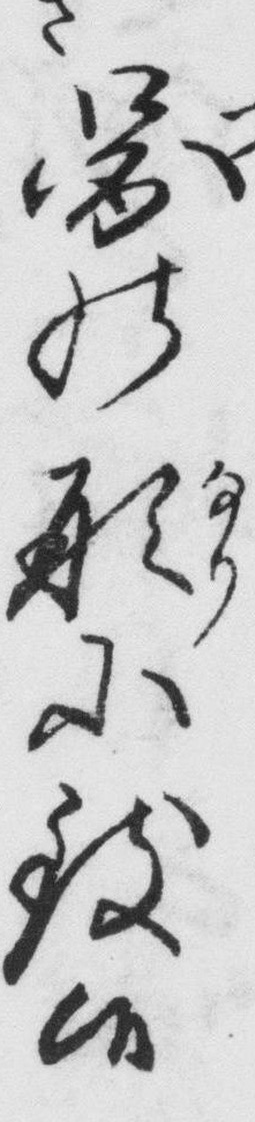図の形に致候
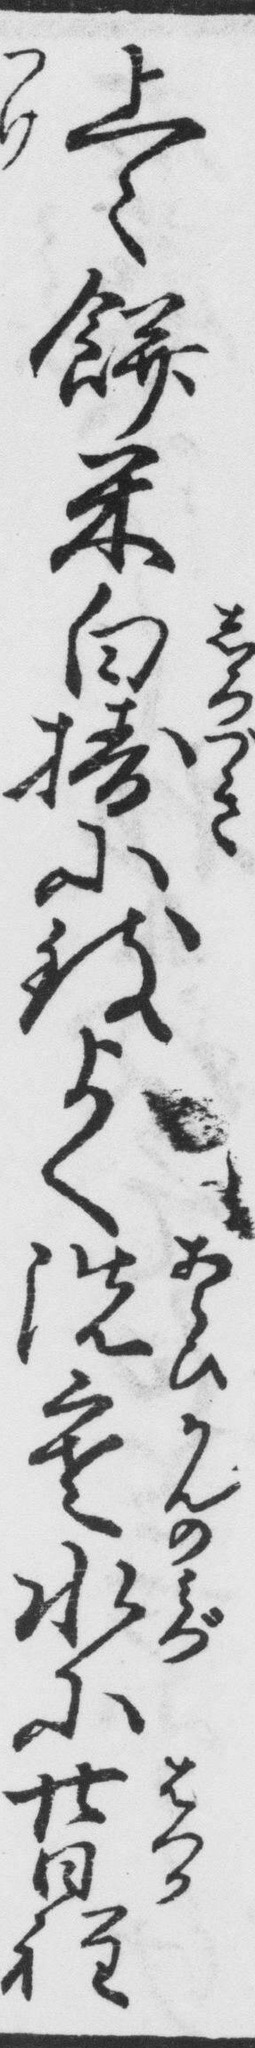上々餅米白擣に致よく洗寒水に廿日程
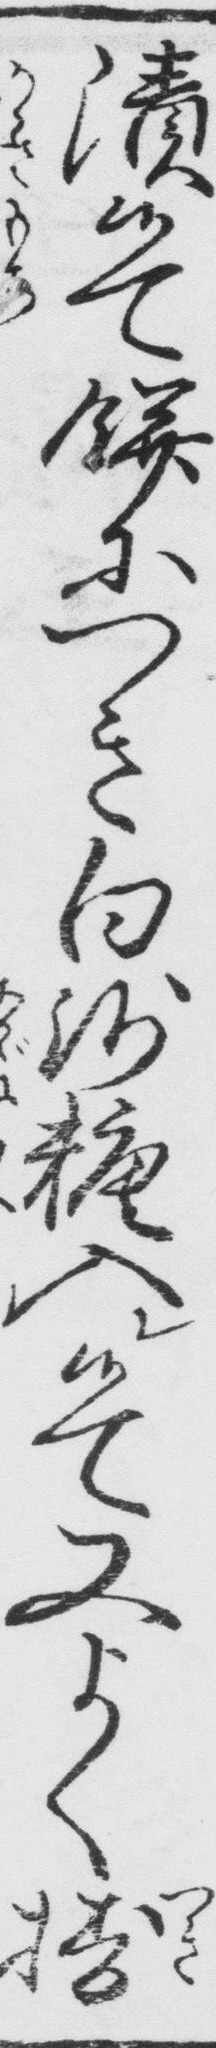漬候て餅につき白沙糖入れ候て又よく擣
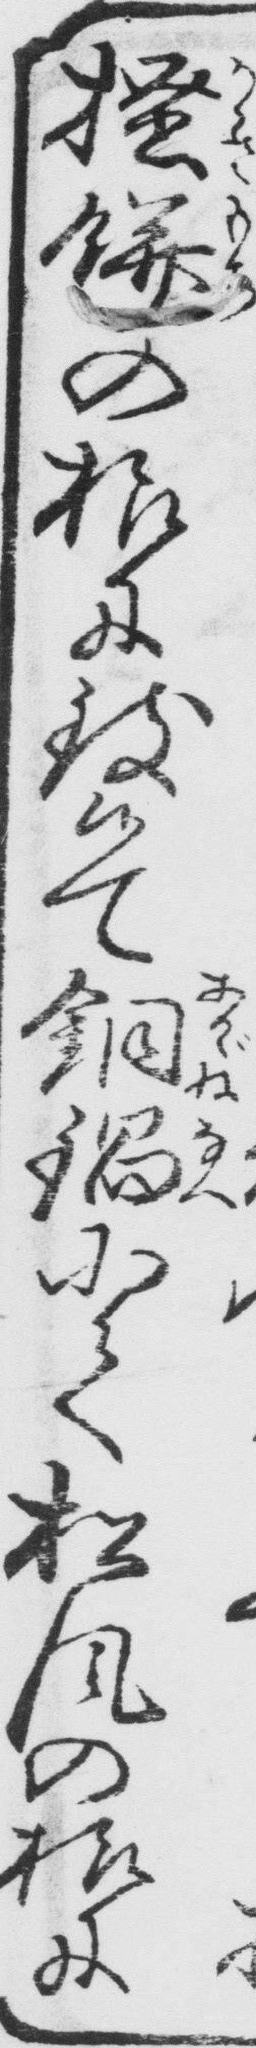掻餅の様に致候て銅鍋にて松風の様に
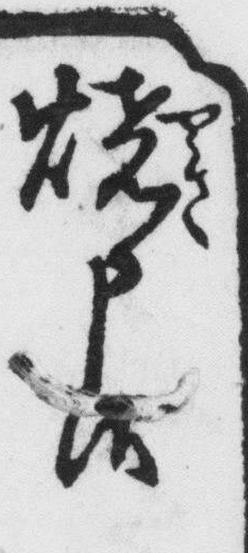焼申候
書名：御前菓子図式
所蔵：大阪府立大学学術情報センター 国文学研究資料館
